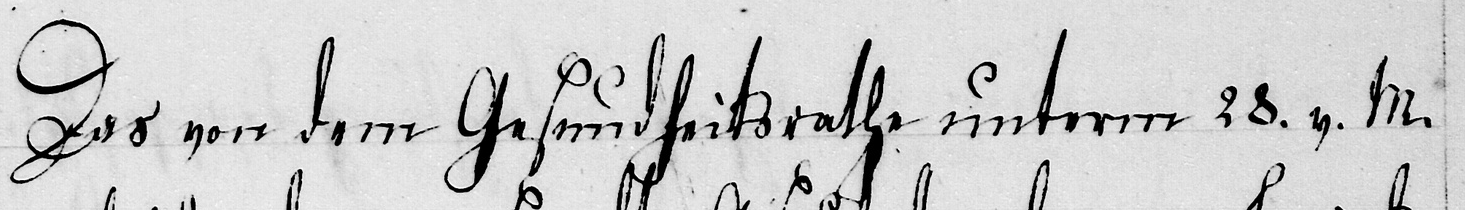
Das von dem Gesundheitsrathe unterm 28. v. M.
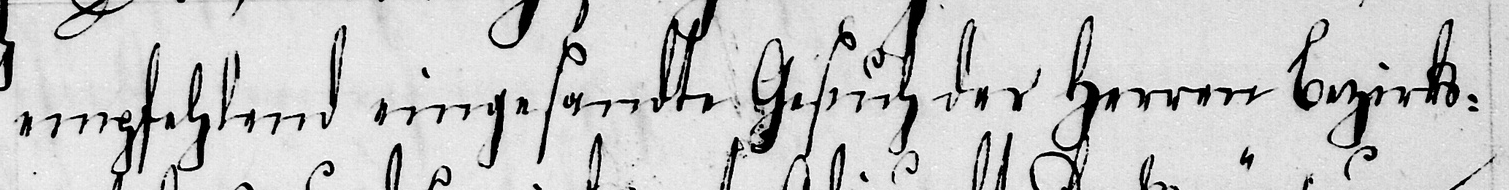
empfehlend eingesandte Gesuch der Herren Bezirks¬
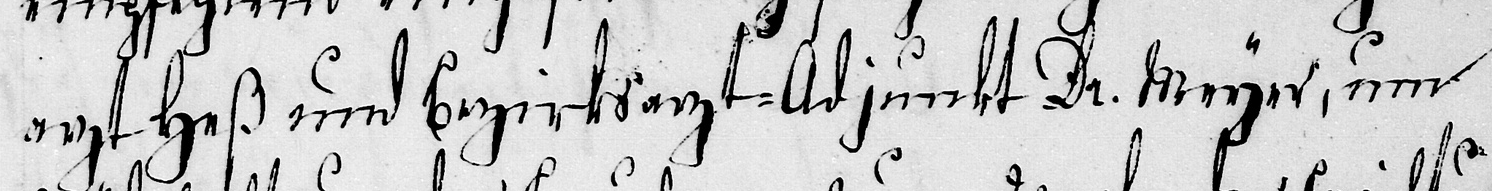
arzt Heß und Bezirksarzt-Adjunkt Dr. Meyer, um
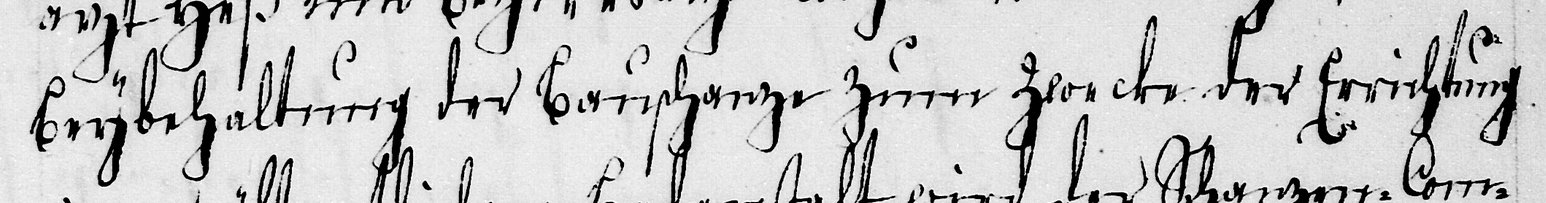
Beybehaltung der Bauschanze zum Zwecke der Errichtung
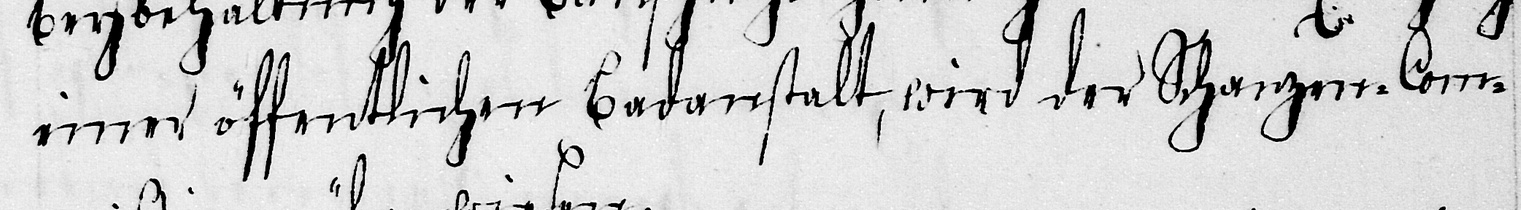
einer öffentlichen Badanstalt, wird der Schanzen-Com¬
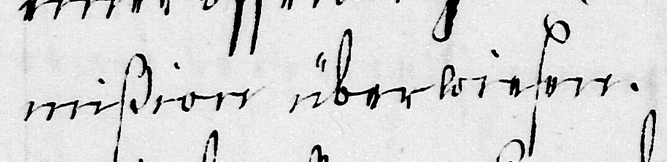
mißion überwiesen.
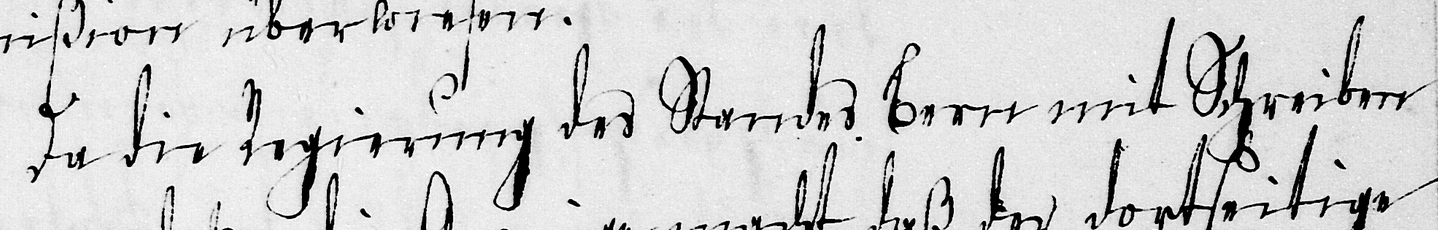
Da die Regierung des Standes Bern mit Schreiben
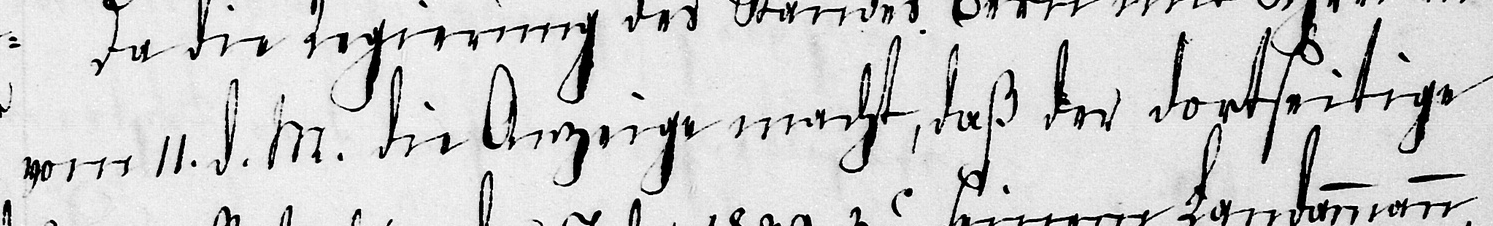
vom 11. d. M. die Anzeige macht, daß der dortseitige
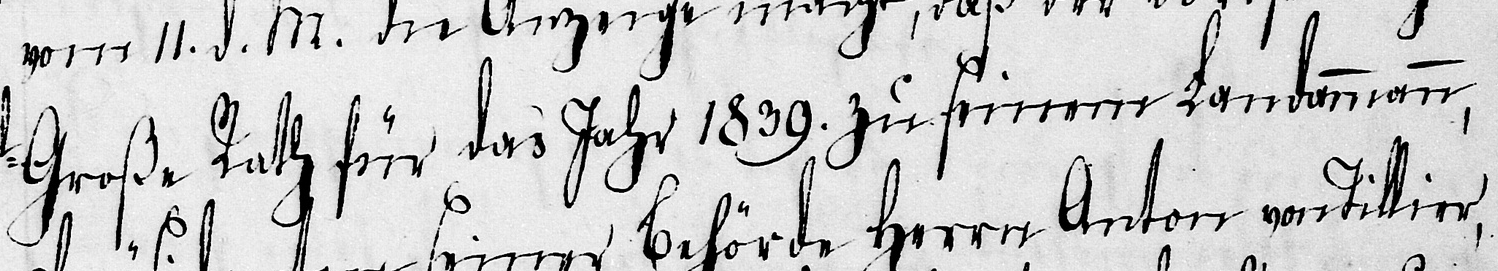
Große Rath für das Jahr 1839. zu seinem Landammann,
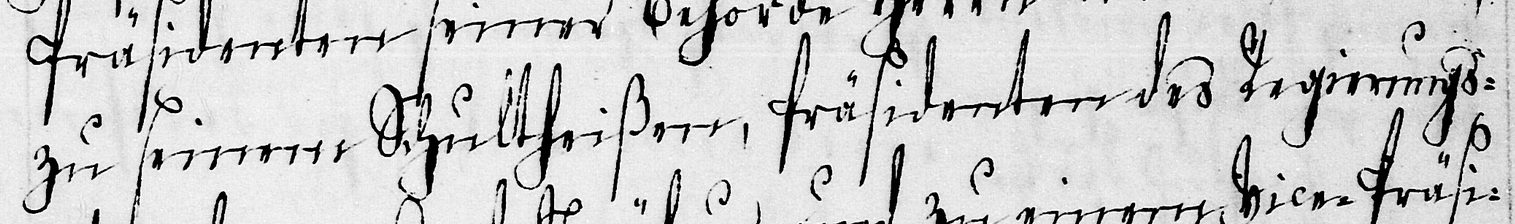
zu seinem Schultheißen, Präsidenten des Regierungs¬
